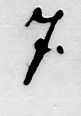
1.)
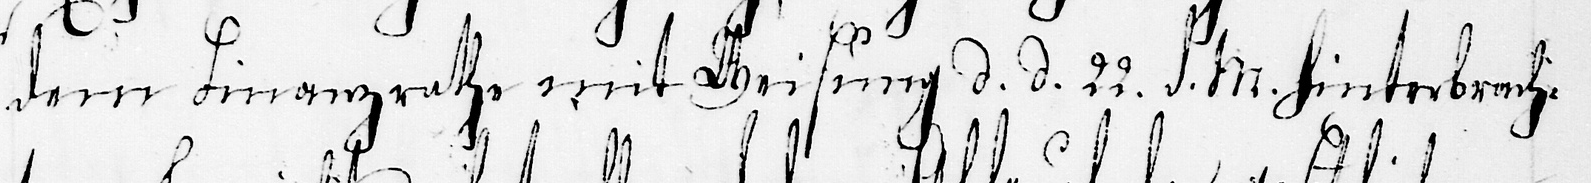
dem Finanzrathe mit Weisung d. d. 22. d. M. hinterbrach¬
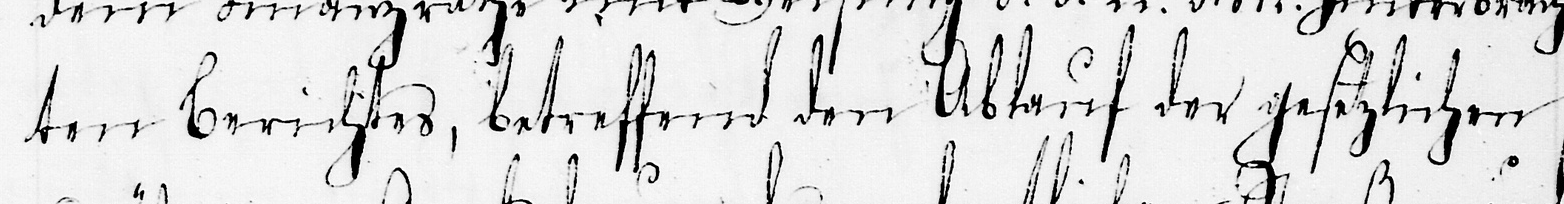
ten Berichtes, betreffend den Ablauf der gesetzlichen
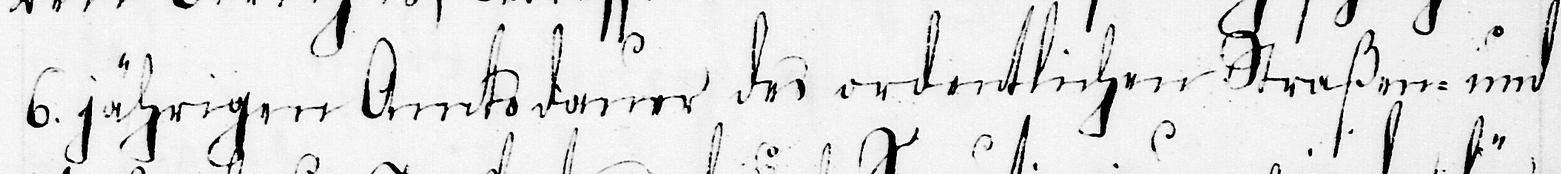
6. jährigen Amtsdauer des ordentlichen Straßen- und
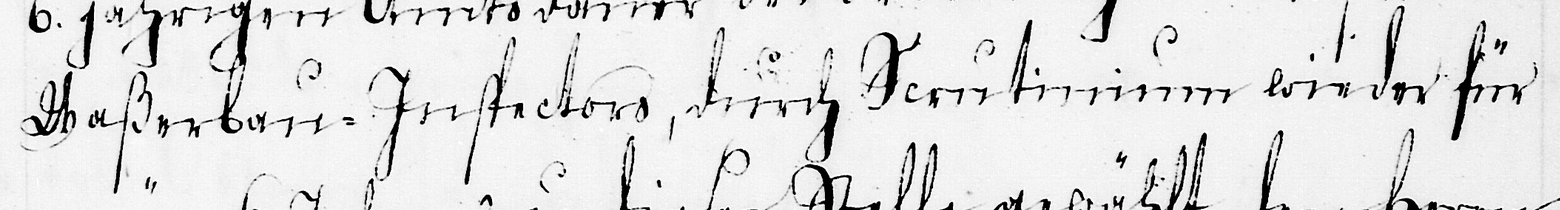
Waßerbau-Inspectors, durch Scrutinium wieder für
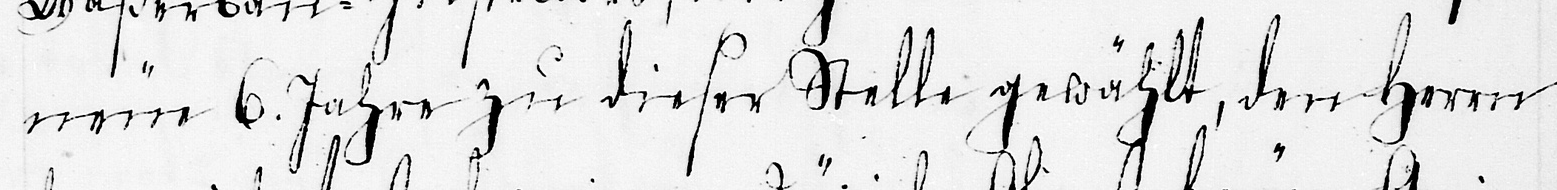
neue 6. Jahre zu dieser Stelle gewählt, den Herrn
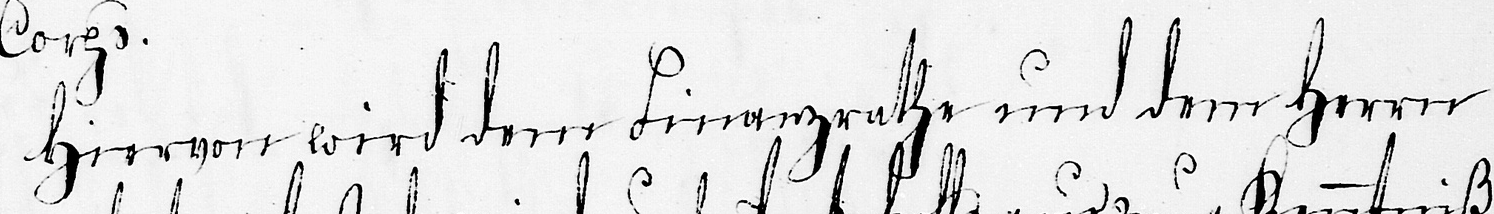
Hiervon wird dem Finanzrathe und dem Herrn
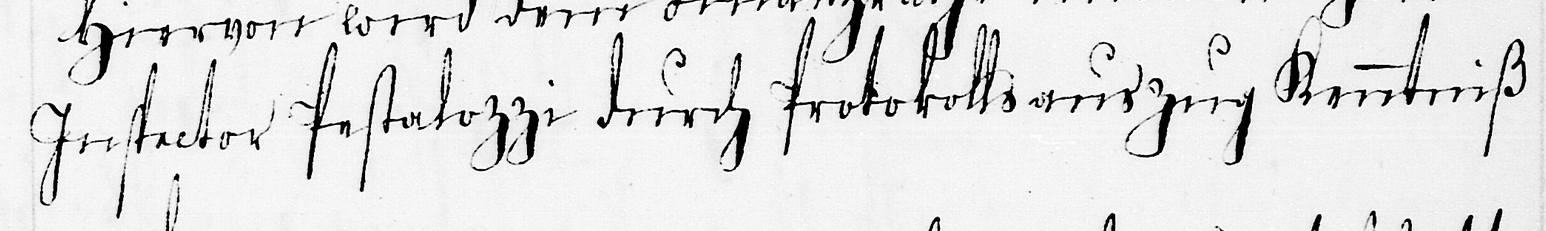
Inspector Pestalozzi durch Protokollsauszug Kenntniß
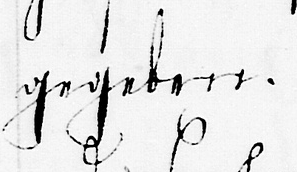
gegeben.
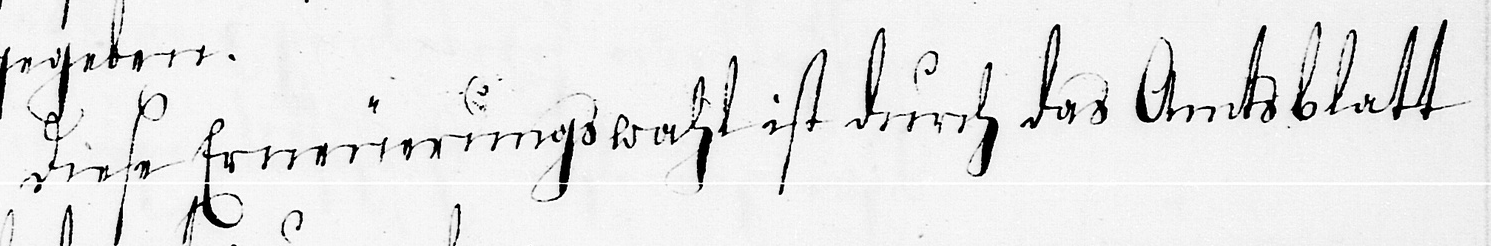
Diese Erneuerungswahl ist durch das Amtsblatt
